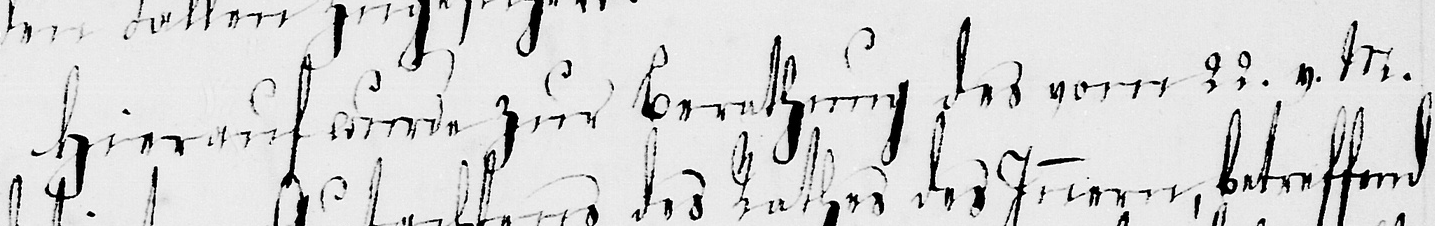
Hierauf wurde zur Berathung des vom 22. v. M.
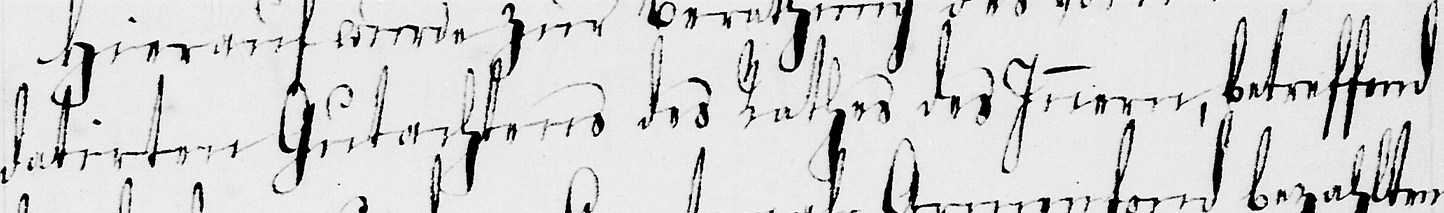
datirten Gutachtens des Rathes des Innern, betreffend
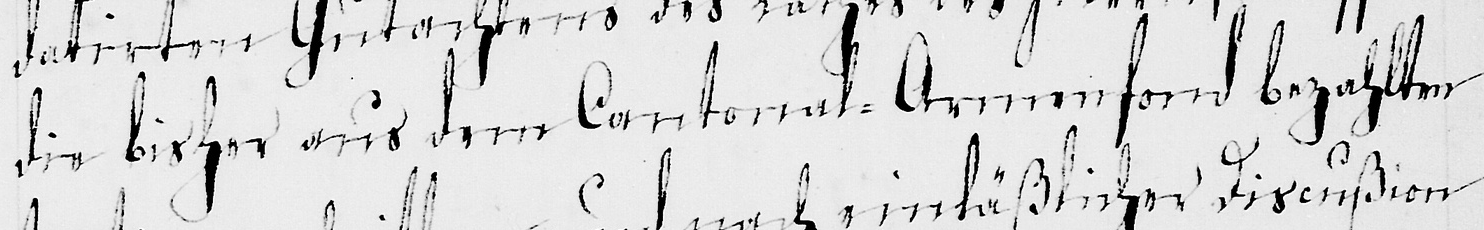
die bisher aus dem Cantonal-Armenfond bezahlten
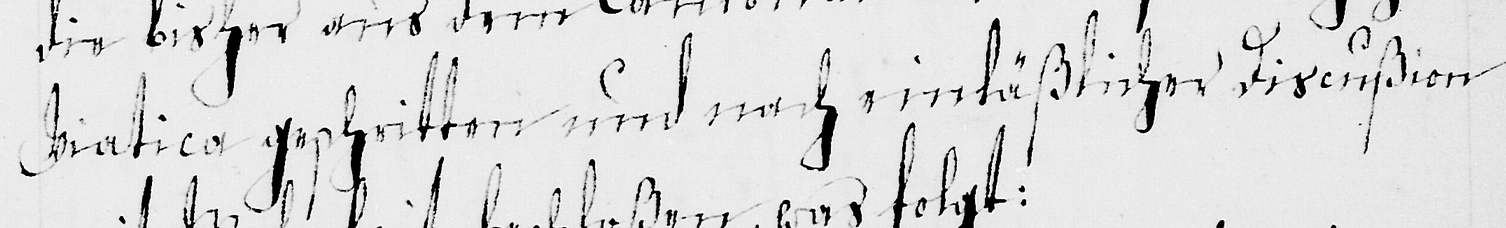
Viatica geschritten und nach einläßlicher Discußion
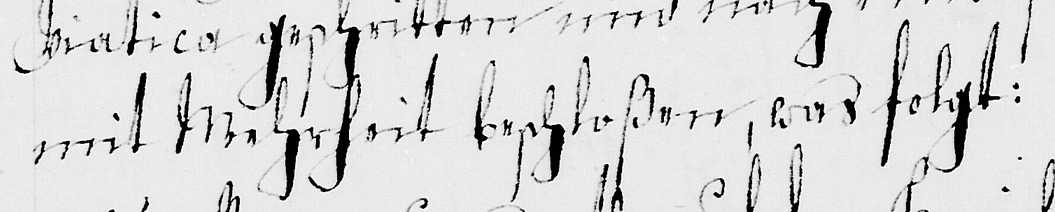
mit Mehrheit beschloßen, was folgt:
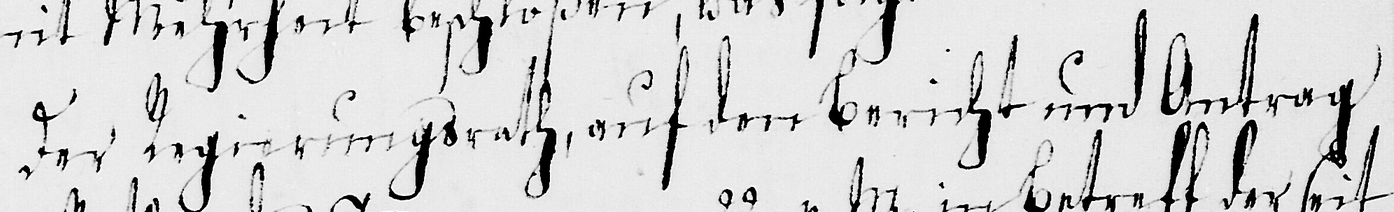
Der Regierungsrath, auf den Bericht und Antrag
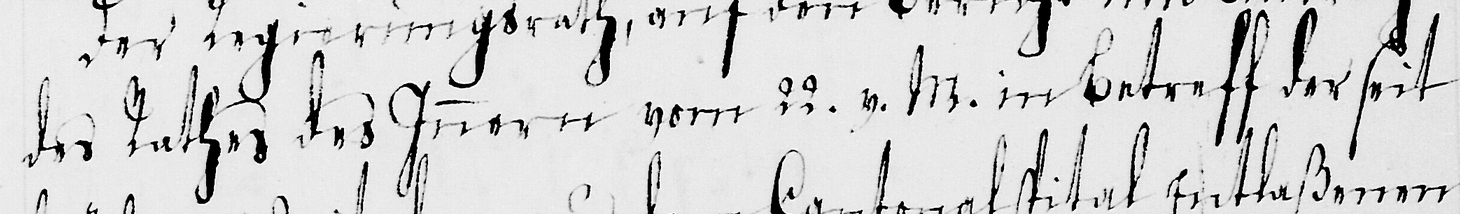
des Rathes des Innern vom 22. v. M. in Betreff der seit
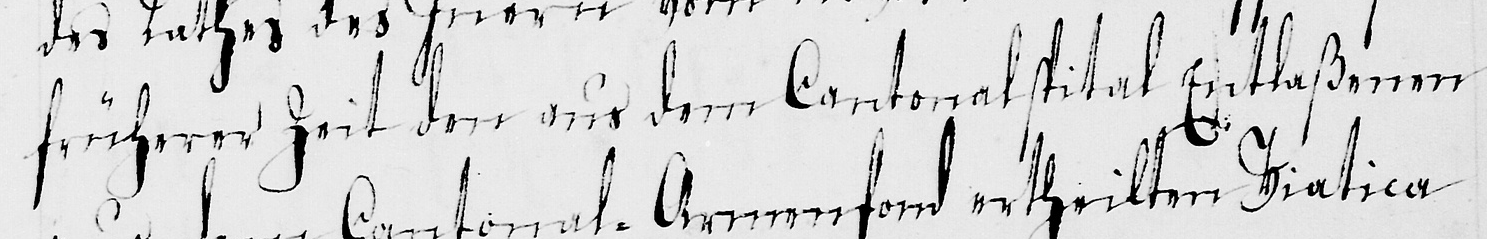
früherer Zeit den aus dem Cantonalspital Entlaßenen
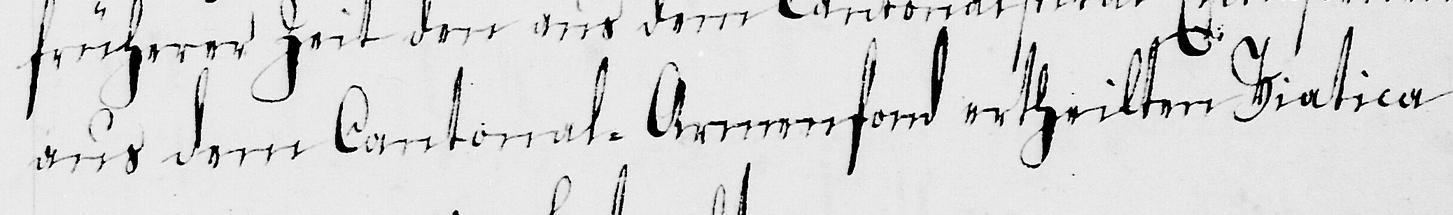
aus dem Cantonal-Armenfond ertheilten Viatica
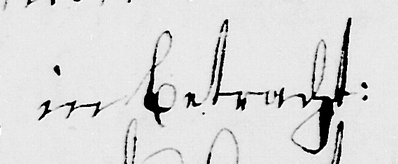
in Betracht:
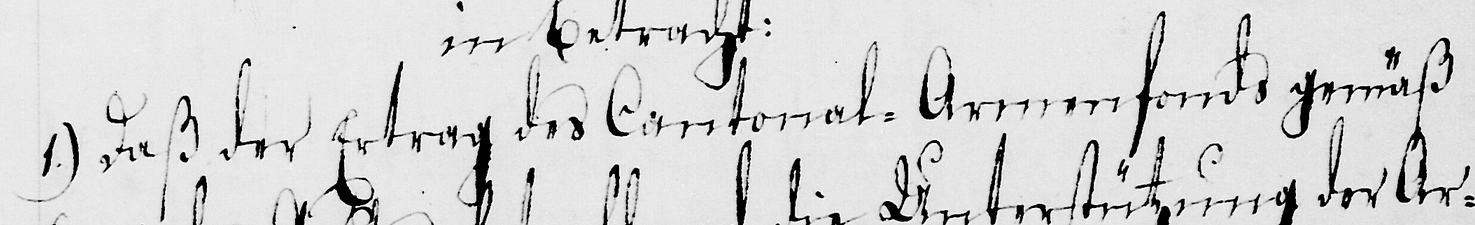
1.) Daß der Ertrag des Cantonal-Armenfonds gemäß
